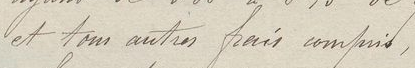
et tous autres frais compris,
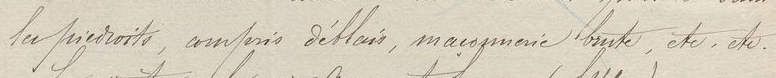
les piedroits, compris déblais, maçonnerie brute, etc, etc.
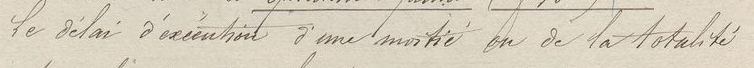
Le délai d'exécution d'une moitié ou de la totalité
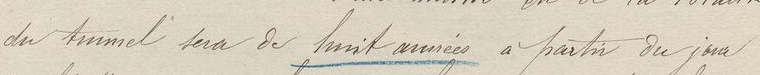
du tunnel sera de huit années à partir du jour
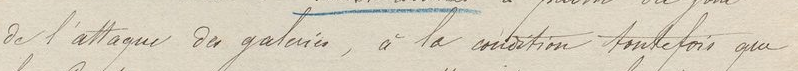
de l'attaque des galeries, à la condition toutefois que
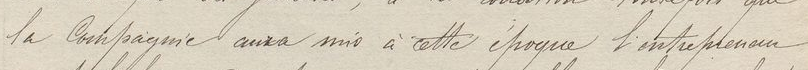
la Compagnie aura mis à cette époque l'entrepreneur
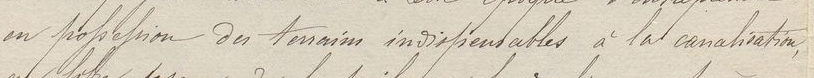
en possession des terrains indispensables à la canalisation,
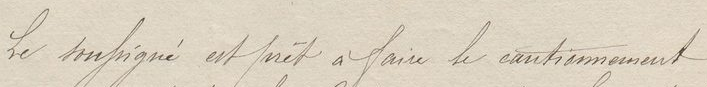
Le soussigné est prêt à faire le cautionnement
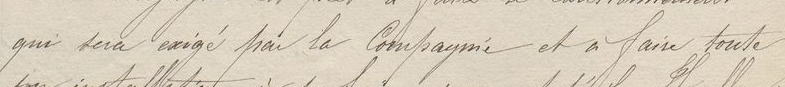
qui sera exigé par la Compagnie et à faire toute
